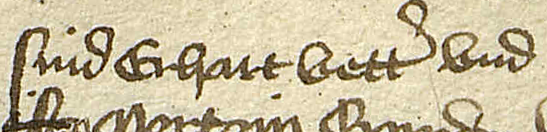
ſind Erhart vett* vnd
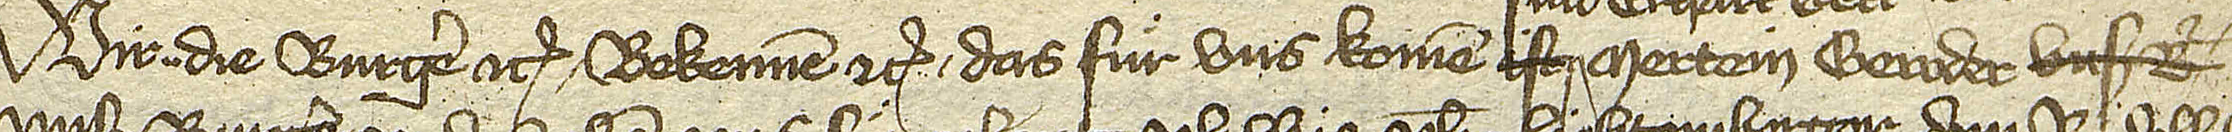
Wir ~ die Burg* ec* / Bekenne* ec* / das für vns kome* iſt Mertein Gewder vnſ* B*
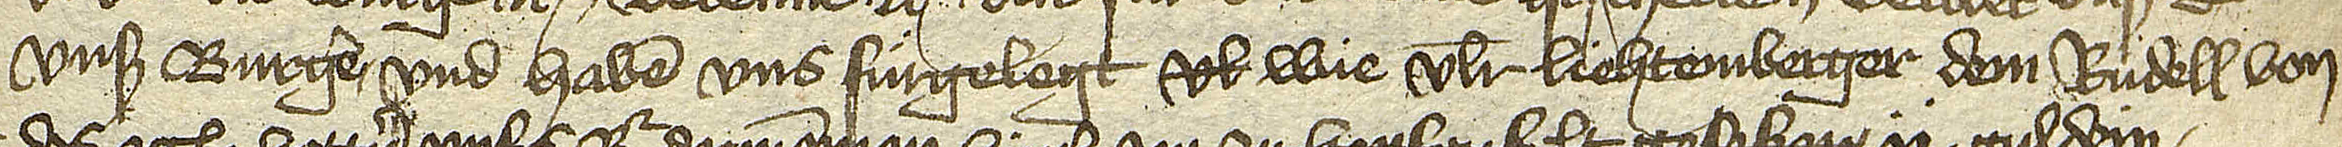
vnſ* Burge* vnd habe* vns fürgelegt vl wie vlr* liehtemberger dem Rüdell von
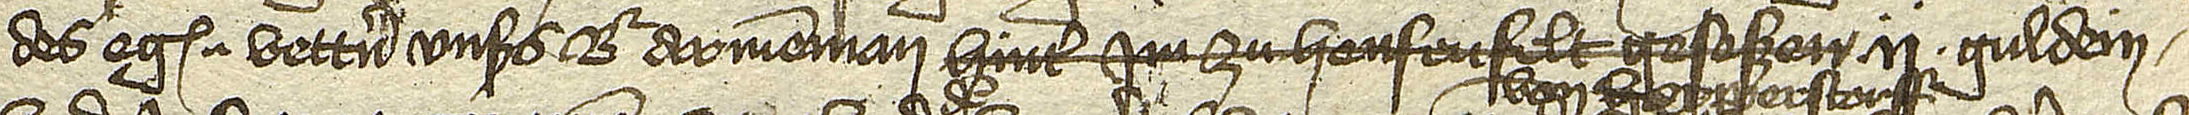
des eg* ~ vettn* vnſ*s B* Arme*man hint* Im cʒu henſenfelt geſeſʒen . ii . guldein /
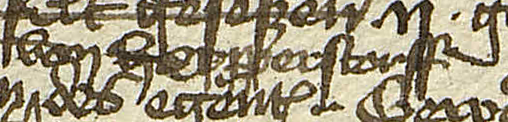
von herperſtorff
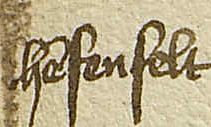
he*ſenfelt
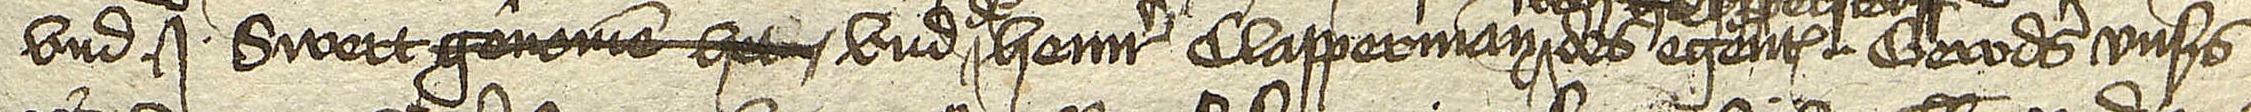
vnd . i . Swert genome* het / vnd heinr* Clapperman des egen*t* ~ Gewds vnſ*s
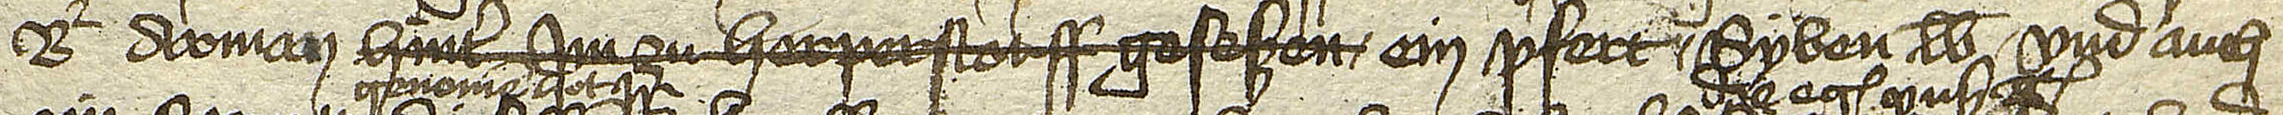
B* Arman hint* Im cʒu herperſtorff geſeſʒen / ein pfert / Syben w* / vnd auch
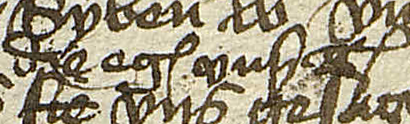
die eg* vnſ* B*
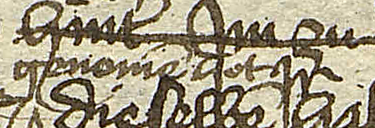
genome* het Ir
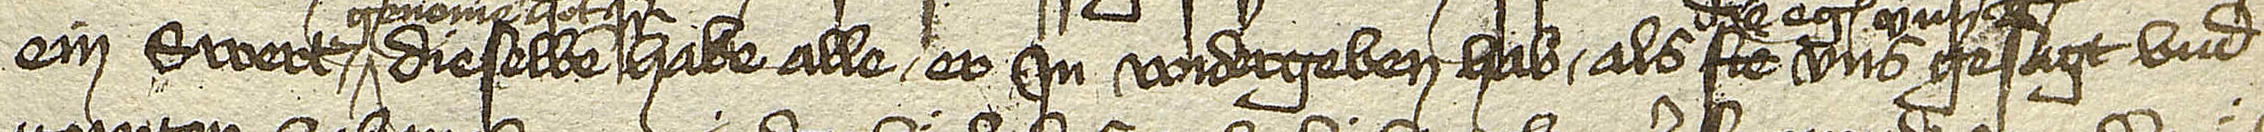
ein Swert dieſelbe* habe alle / er In widergeben hab / als ſie vns geſagt vnd
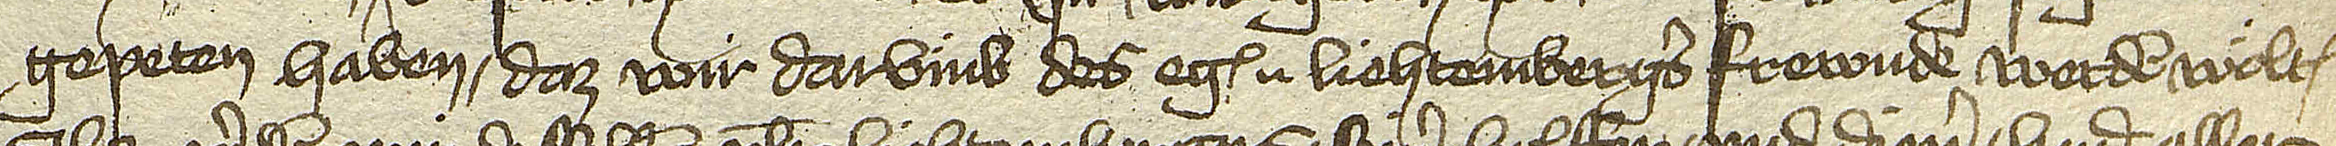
gepeten haben / daʒ wir darv̈mb des eg* ~ liehtembergs* frewnde werd* wölt*
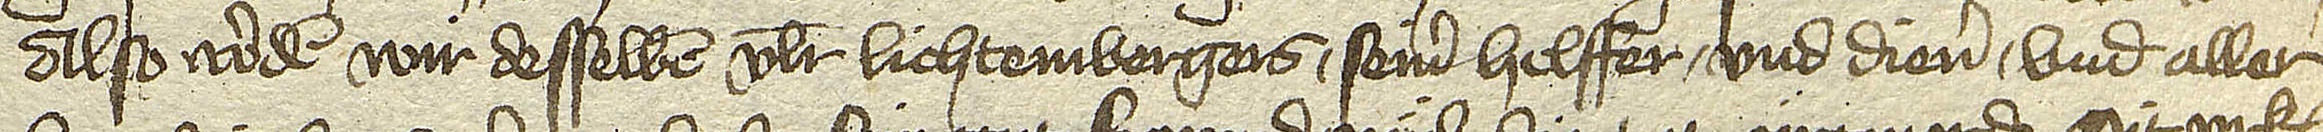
Alſo w*d* wir deſſelbe* vlr* lichtembergers / ſein* helffer / vnd dien* / vnd aller
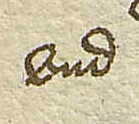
vnd
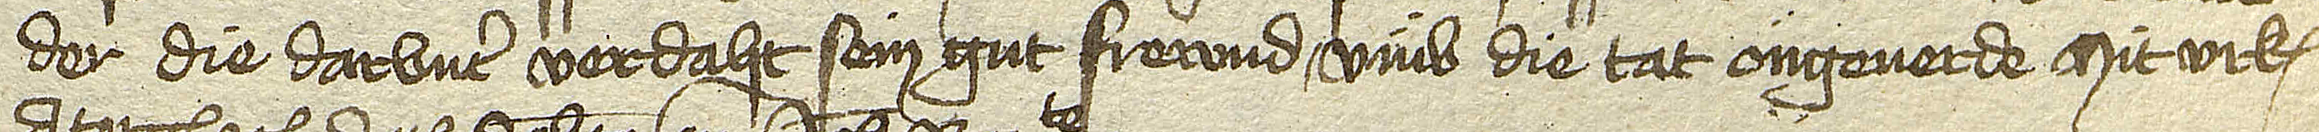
der die darvnt* verdaht ſein gut frewnd / v̈mb die tat ongeuerde Mit vrk*
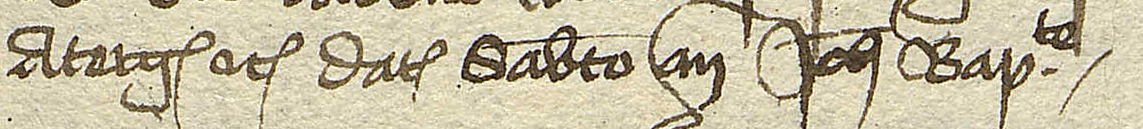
Aterg* ec* dat* Sabto* an* Ioh* Bap* . /
